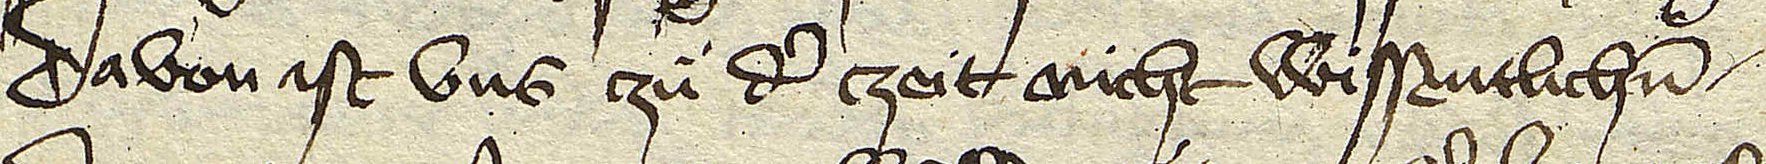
Davon iſt vns cʒü d* cʒeit nicht wiſſentlichn* /
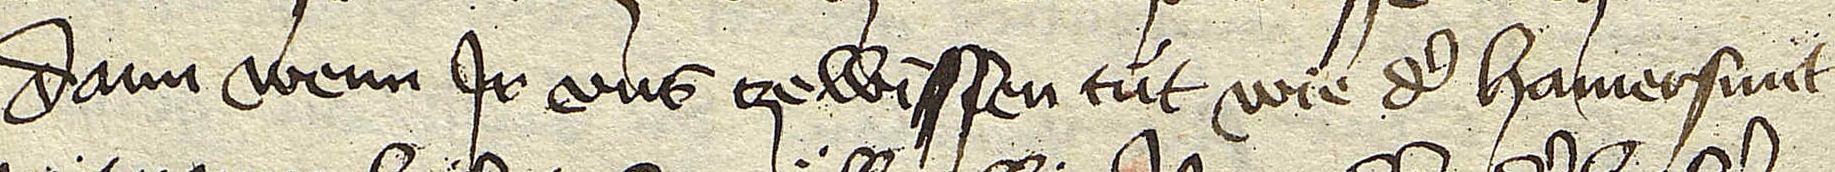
Dann wenn Ir vns cʒewiſſen tüt wie d* Hamerſit
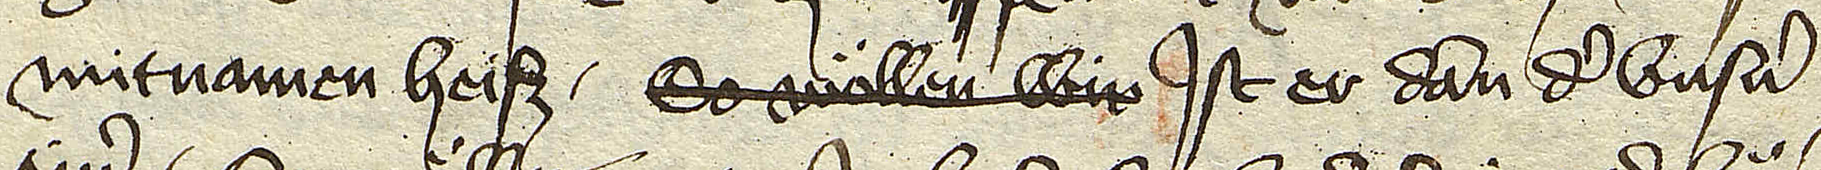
mitnamen heiſʒ / So wöllen wir Iſt er dan* d* vnſn*
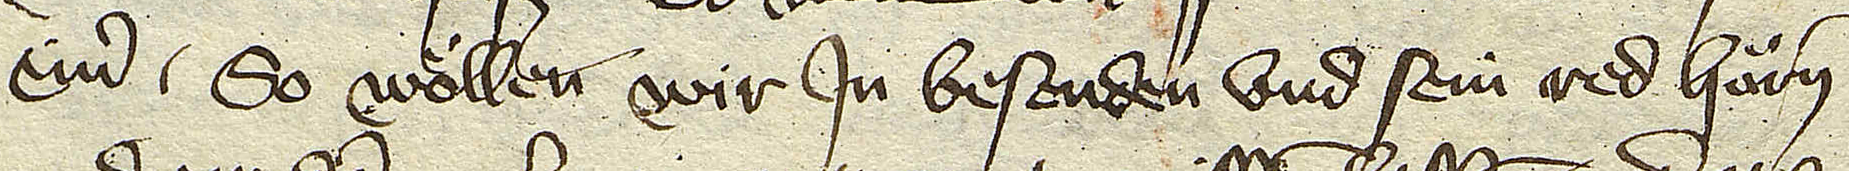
ein* / So wöllen wir In beſenden vnd ſein red hörn*
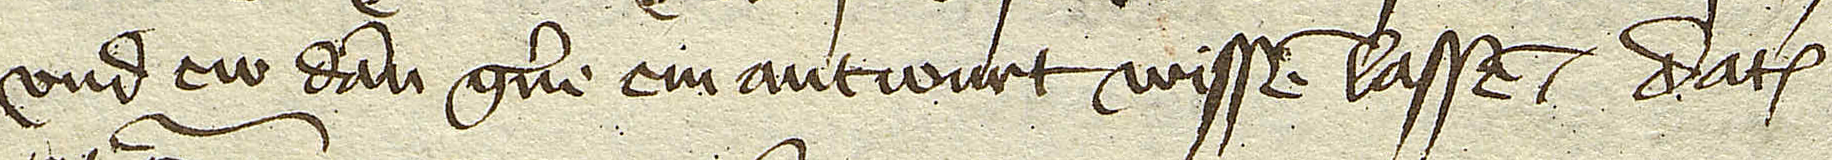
vnd ew dan* g*ne ein antwurt wiſſe* laſſe* / Dat*
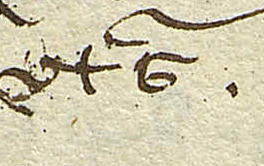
vts* .
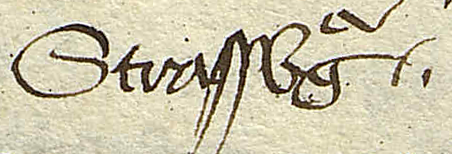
Straſſb*g / .
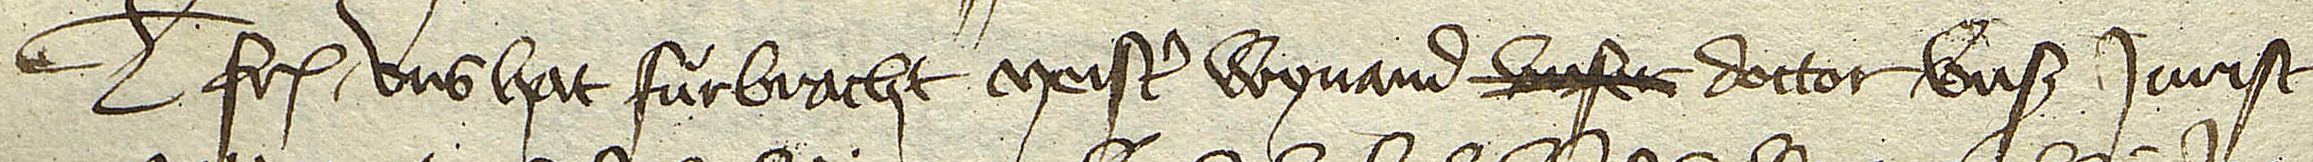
L* fr* / Vns hat fürbracht Meiſt* Wynand vnſer doctor / vnſ* Iuriſt
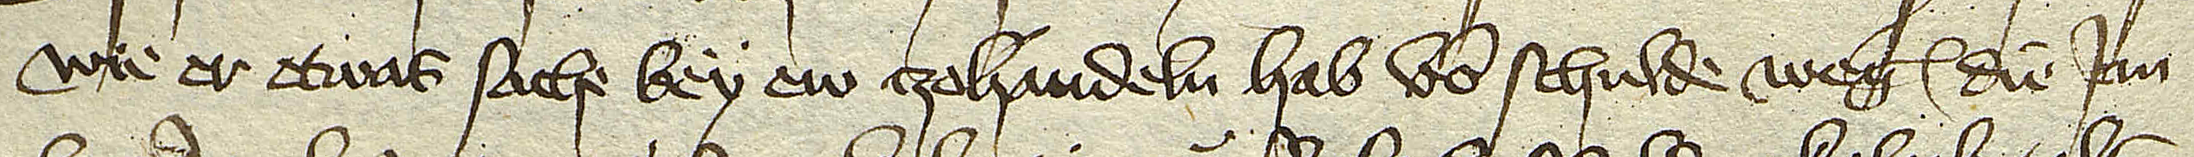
wie er etwas ſache bey ew cʒehandeln hab vo* ſchulde weg* die Im
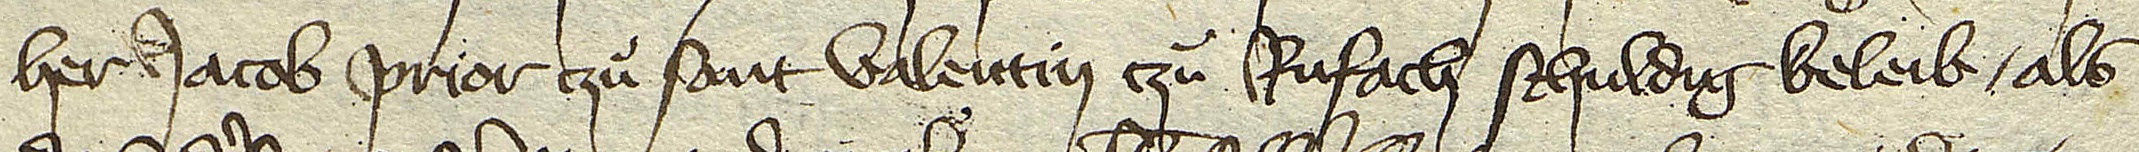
her Iacob prior cʒü ſant valentin cʒü Rufach ſchuldig beleib / als
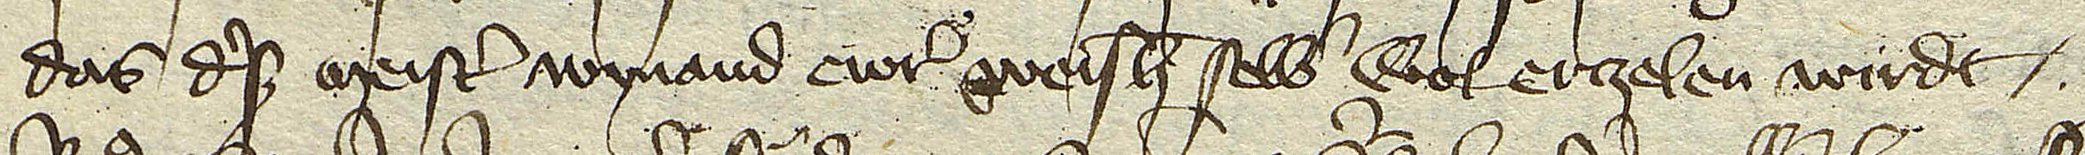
das d*ſ* Meiſt* wynand ewr* weiſh* ſelb* wol ercʒelen wirdt / .
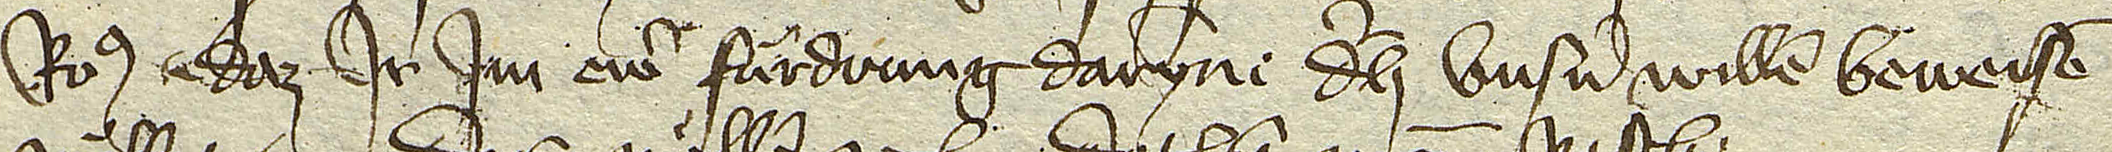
Ro* / daʒ Ir Im ew* fürdrung daryne* d*h vnſn* wille* beweiſe*
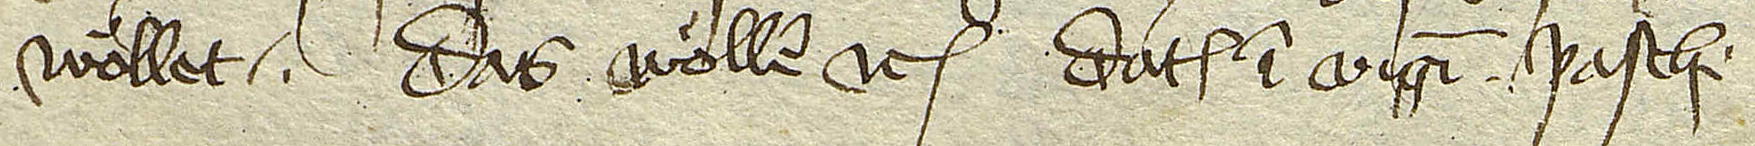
wöllet / . Das wölle* ec* Dat* i* vigi* paſche
